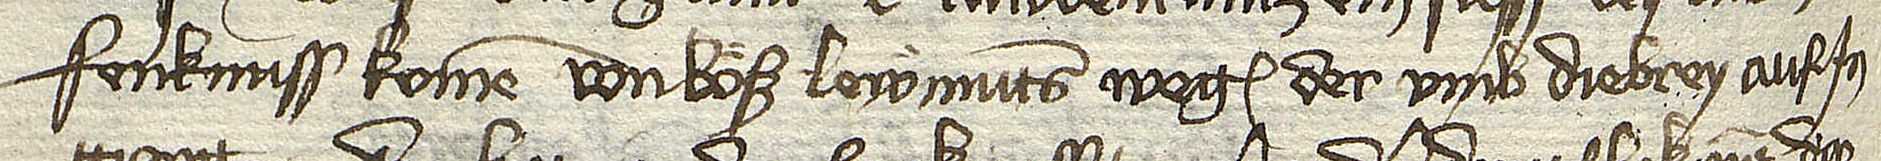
fenknuſſ kome* von böſʒ lewmuts* weg* der vmb diebrey auf In
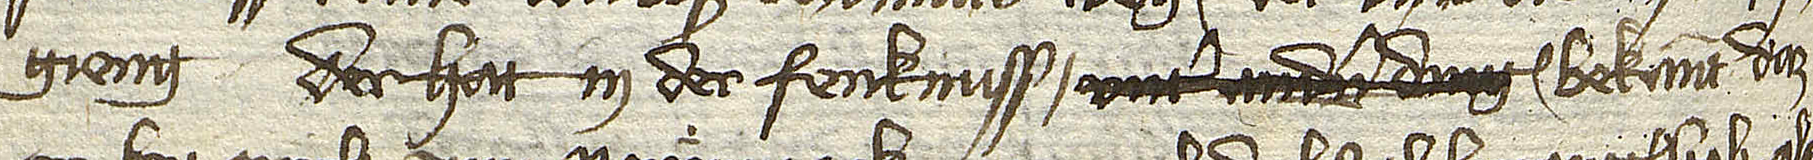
gieng Der hat in der fenknuſſ / vnt* and*n ding* bekant* daʒ
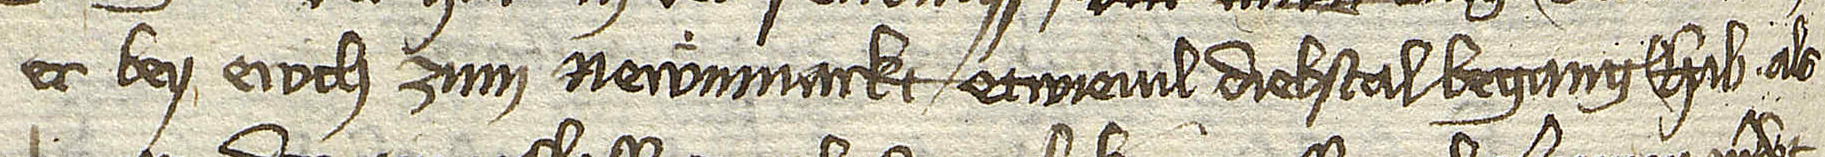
er bey ewch ʒum Newmarkt etwieuil diebſtal begang* hab als
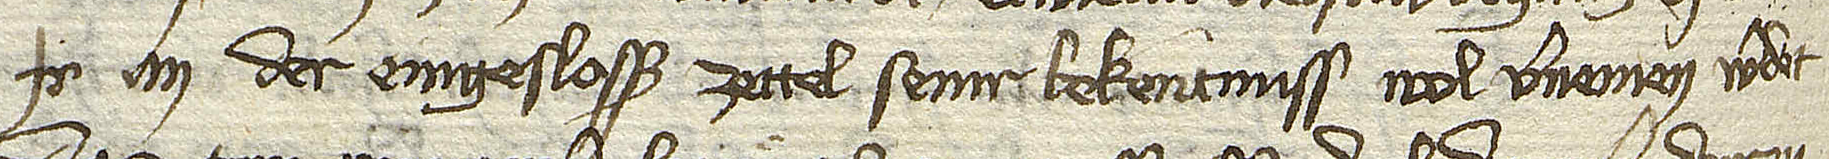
Ir an der eingeſloſſ* ʒettel ſeinr bekentnuſſ wol v*nemen w*det
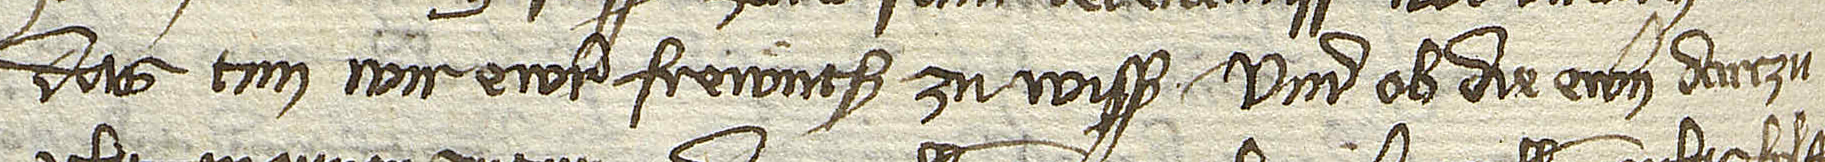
Das tun wir ewr* frewntſ* ʒu wiſſ* / Vnd ob die ewn* darcʒu
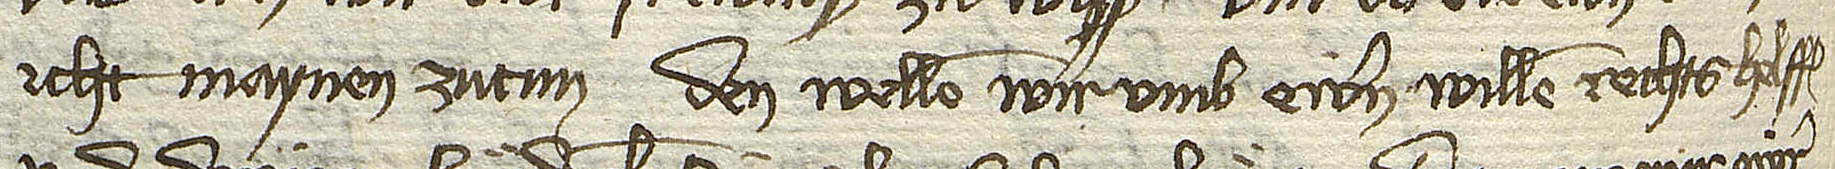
icht maynen ʒutun den welle* wir vmb ew*n wille* rechts hellf*
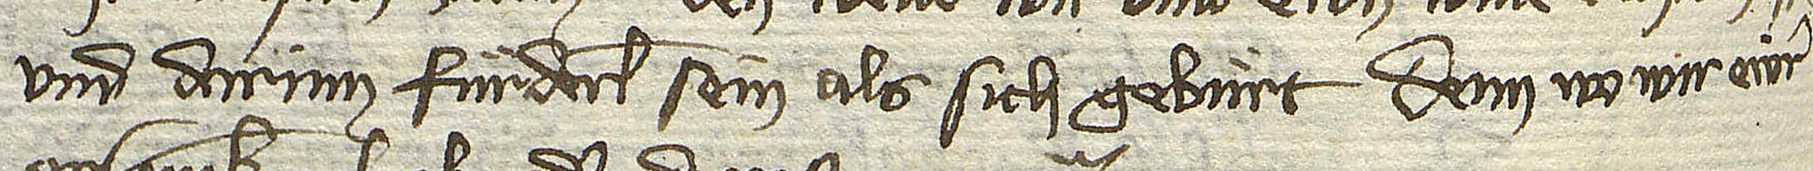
vnd darinn fürderl* ſein als ſich gebürt Denn wo wir ewr*
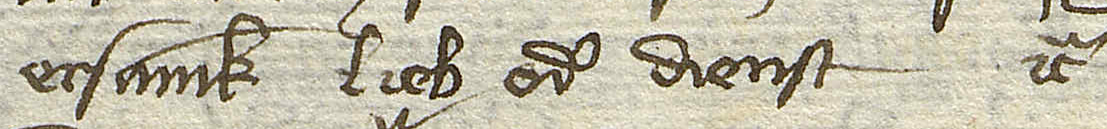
erſamk* lieb od* dienſt ec*
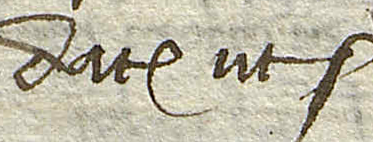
Dat* ut ſ*
